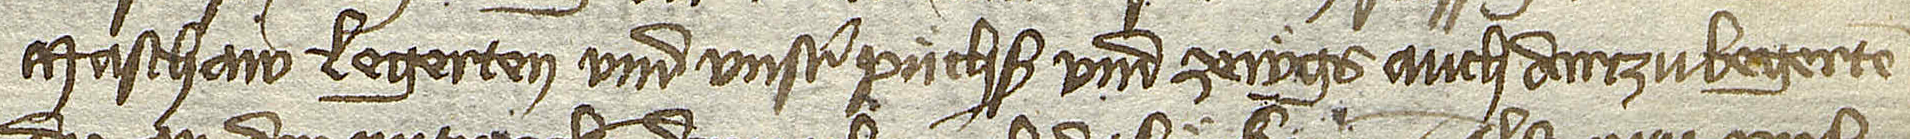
Maſchaw legerten vnd vnſ*r püchſ* vnd ʒewgs auch darcʒu begerte*
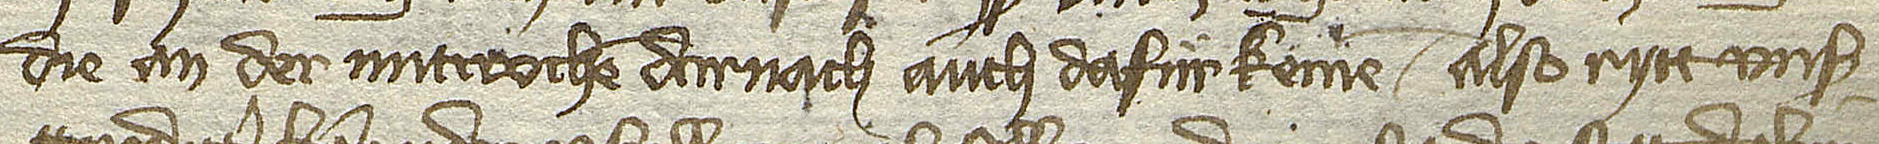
die an der mitwoche* darnach auch dafür keme* / alſo rytt vnſ*
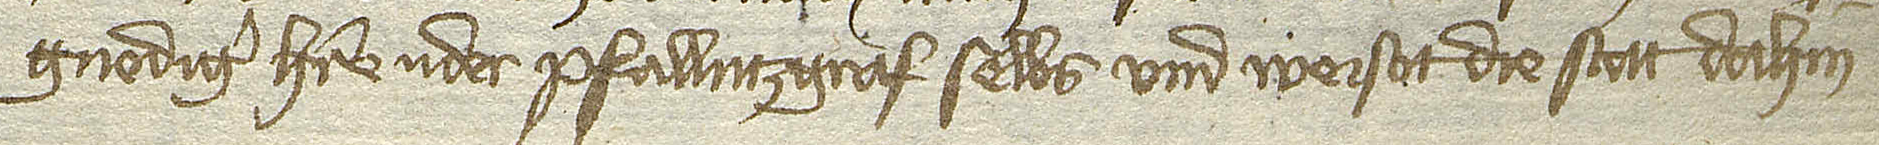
gnedig* h*re ~der pfallncʒgraf ſelbs vnd weiſet die ſtat dahin
